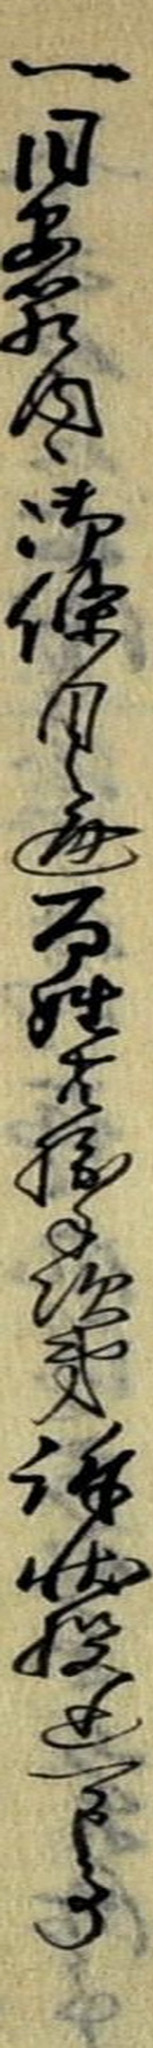一目安箱内へ御条目之通百姓共勝手次第訴状投込可申事
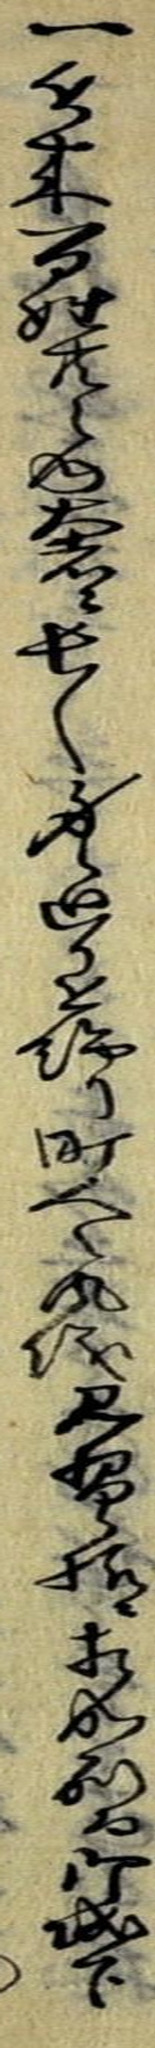一近来百姓共之内奢ニ長し身之廻りを飾り町人之風儀見習候様ニ相成別而御城下
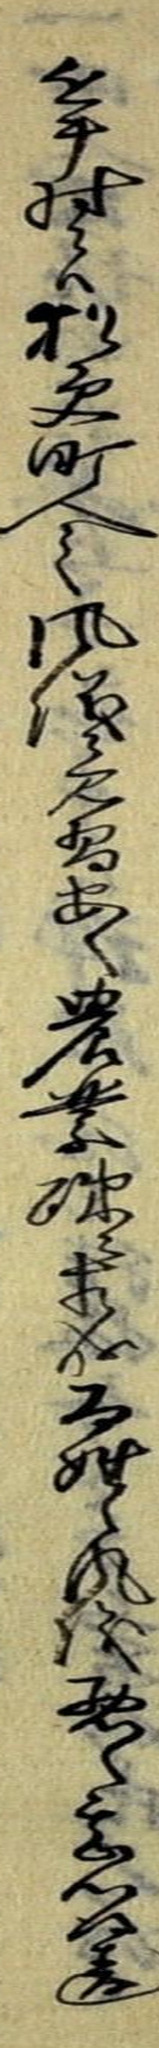近キ村々ハ猶更町人之風儀ニ見習安く農業疎ニ相成百姓之風儀悪く甚心得違
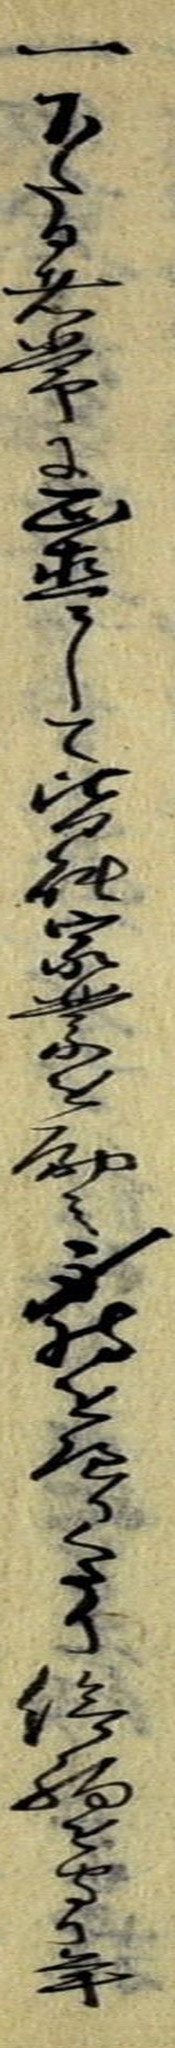一下たる者常に正直ニして皆能家業を励ミ身持をへりくたり倹約を守り年
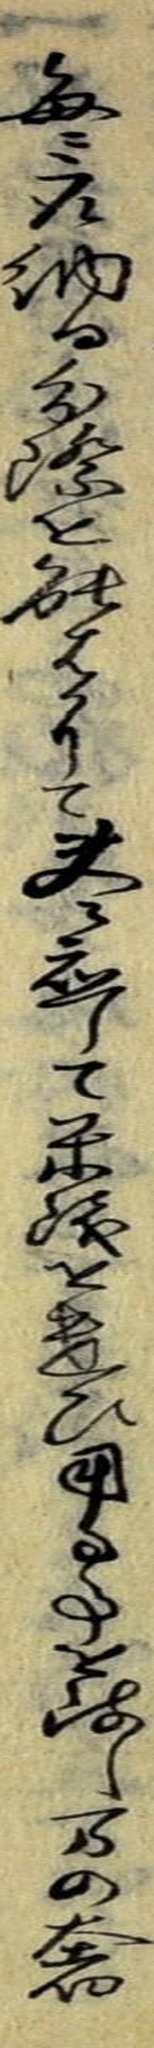毎ニ取納る分際を能はかりて夫ニ応して米銭を遣ひ用る事を致し万の奢
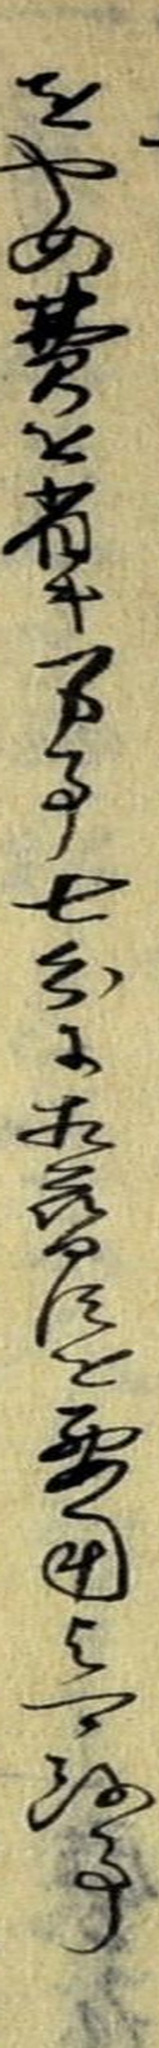をやめ費を省キ万事七分に相暮すを要用与可致事
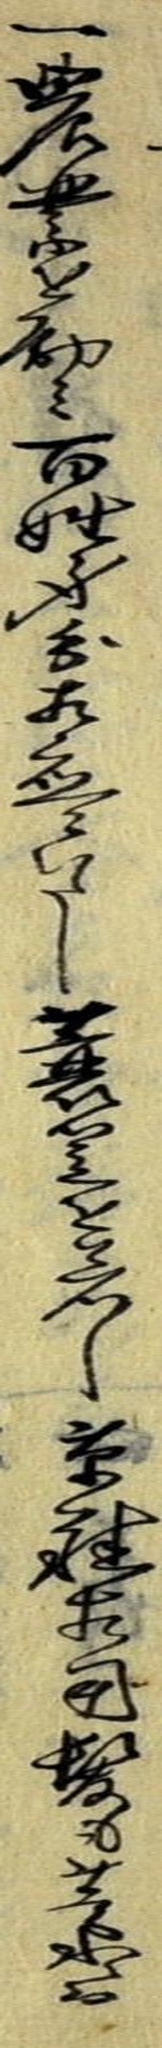一農業を励ミ百姓身分相応ニいたし蓑笠を着し草鞋相用髪も稾ニ而
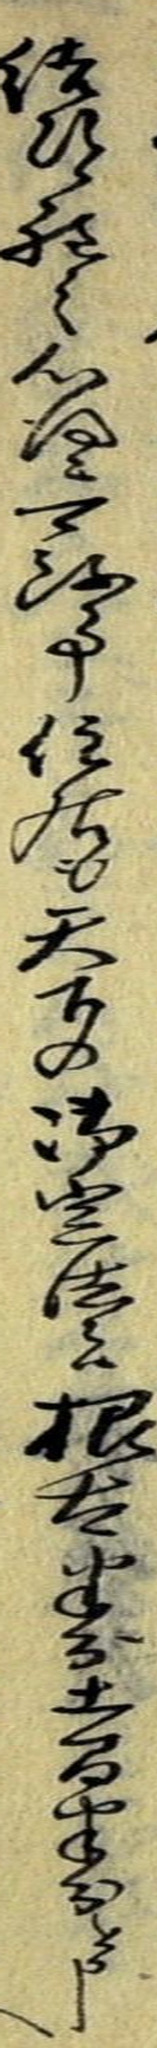結ひ候程之心得ニ可致事住居も天下の御定法ニハ根太半分土間半分と申
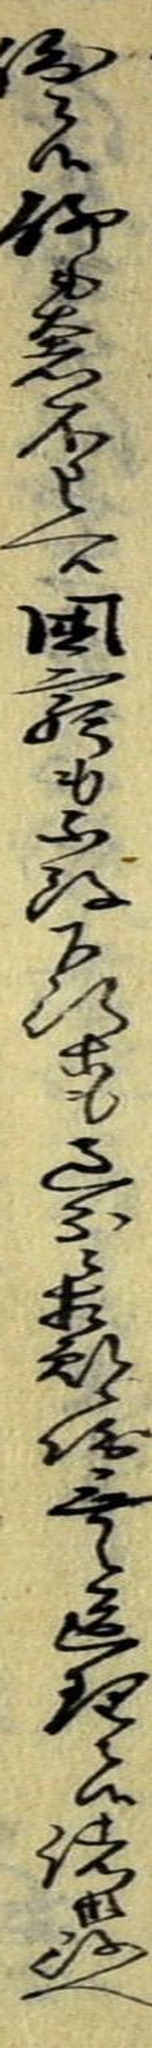儀ニ候聊も奢不申候ヘハ困窮も不致下行等も過分ニ相願候儀無之道理ニ候諸御役人
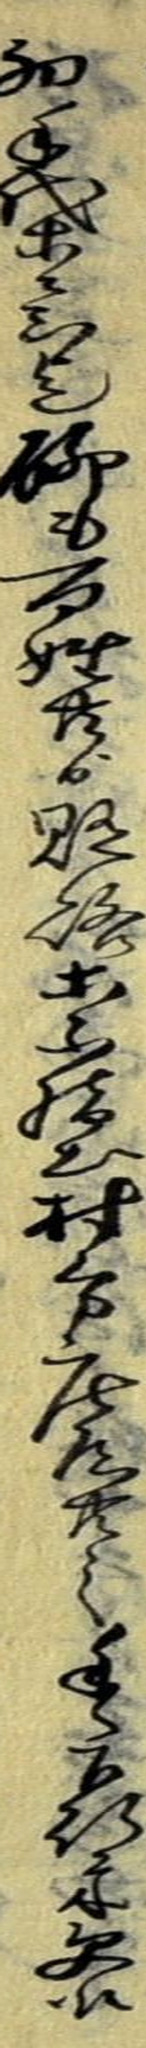初手代等ニ至迄聊も百姓共ゟ賄賂等不指出村方庄屋共之手へ下行米受取
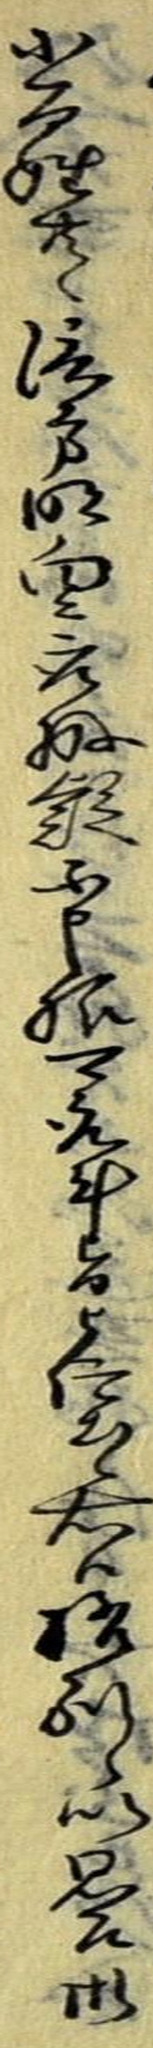小百姓共へ渡方明白ニ取扱疑不申様可取計旨被仰出候右ハ格別之以思召御

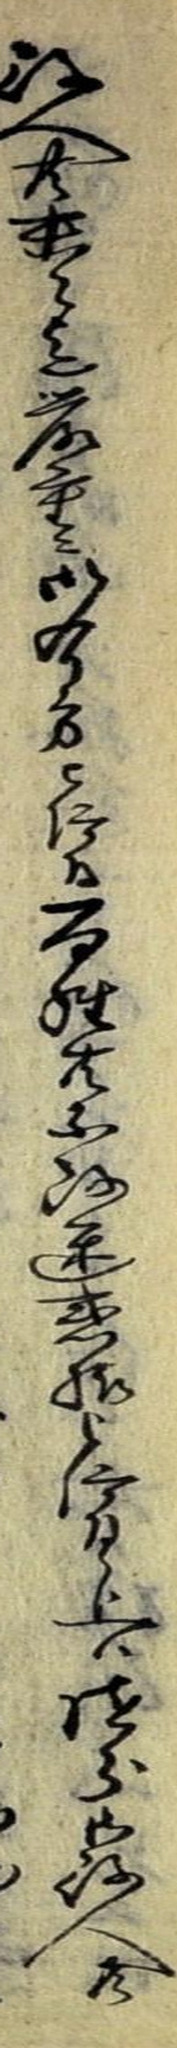役人共末々迄厳重ニ御〆り方被仰付百姓共不致迷惑様被仰付候上ハ随分御役人共
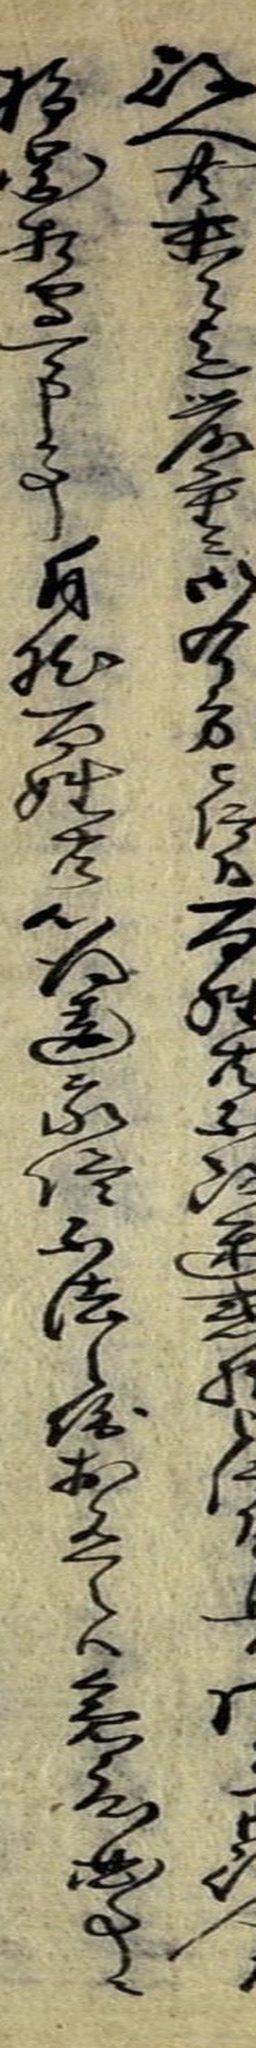指図相守可申事自然百姓共心得違我儘不法之儀於有之ハ急度曲事ニ
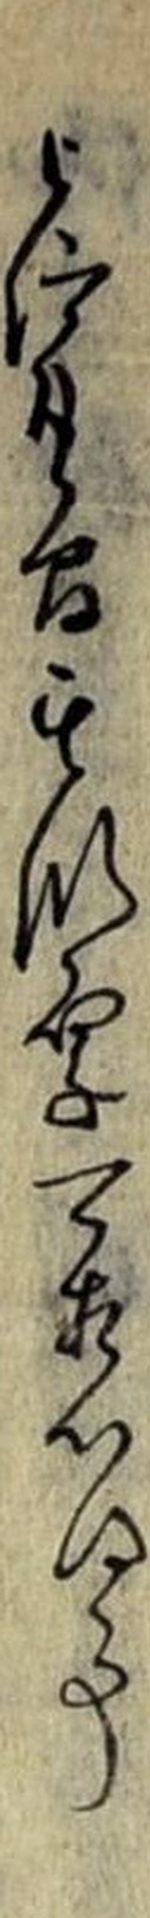被仰付候間其段厚可相心得事
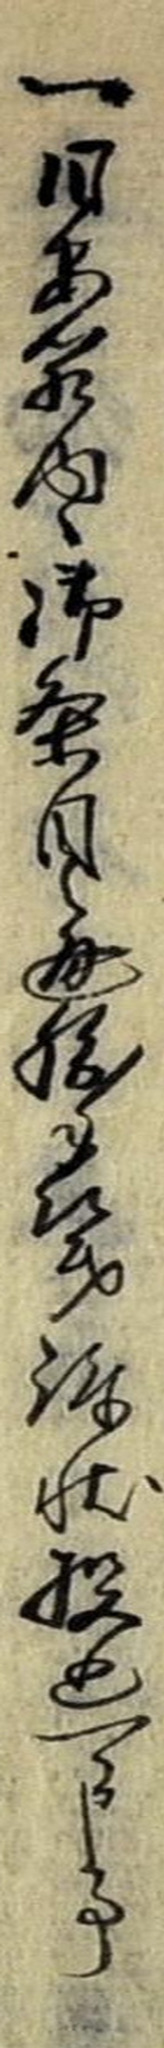一目安箱内へ御条目之通勝手次第訴状投込可申事
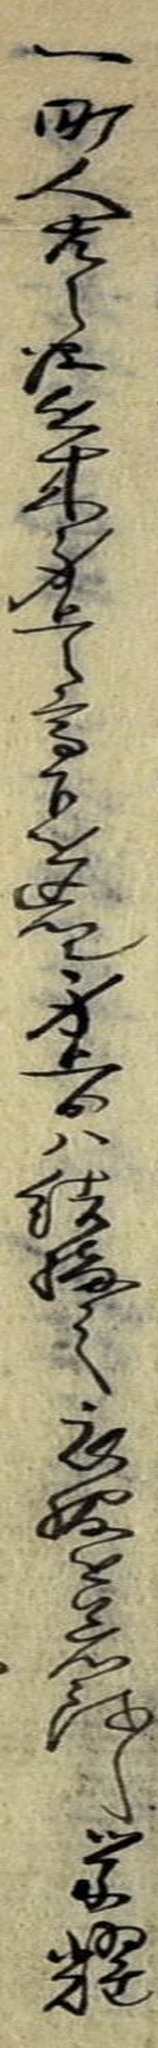一町人共之儀近来身上之高下を忘レ身上ゟハ結構之衣服を着致し栄耀
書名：命令之部 三
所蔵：福井県文書館 Fukui Prefectural Archives
